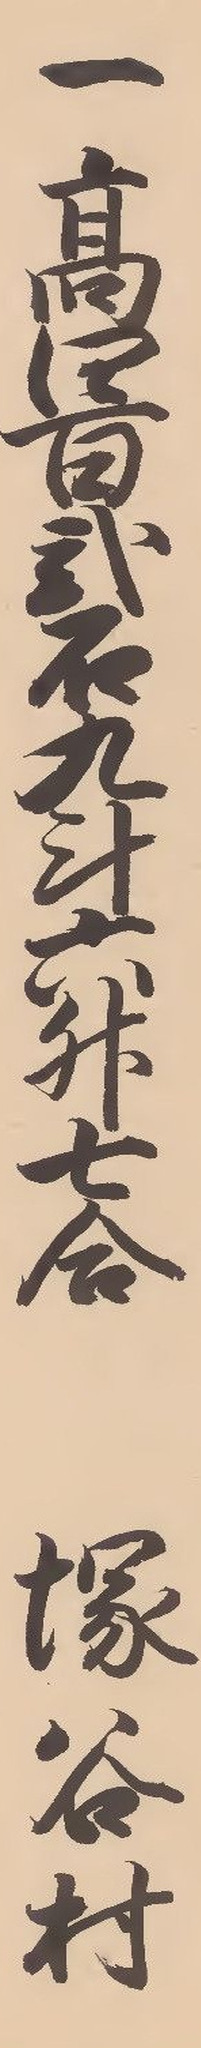一高四百弐石九斗六升七合塚谷村
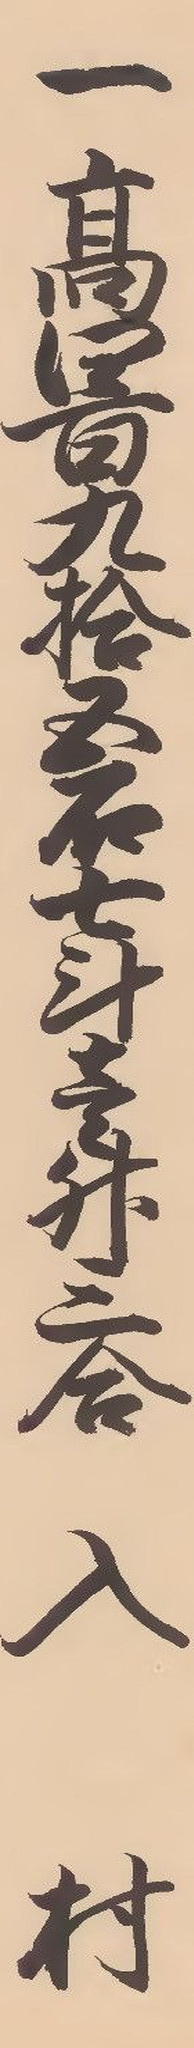一高四百九拾五石七斗壱升三合入村
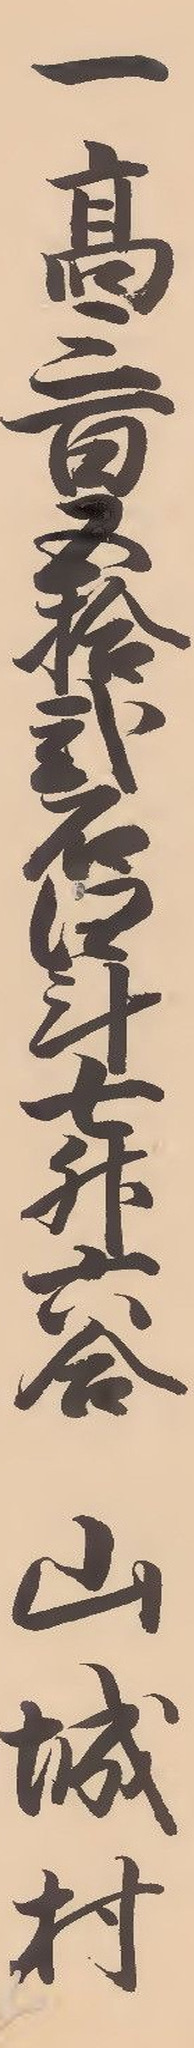一高三百五拾弐石四斗七升六合山城村
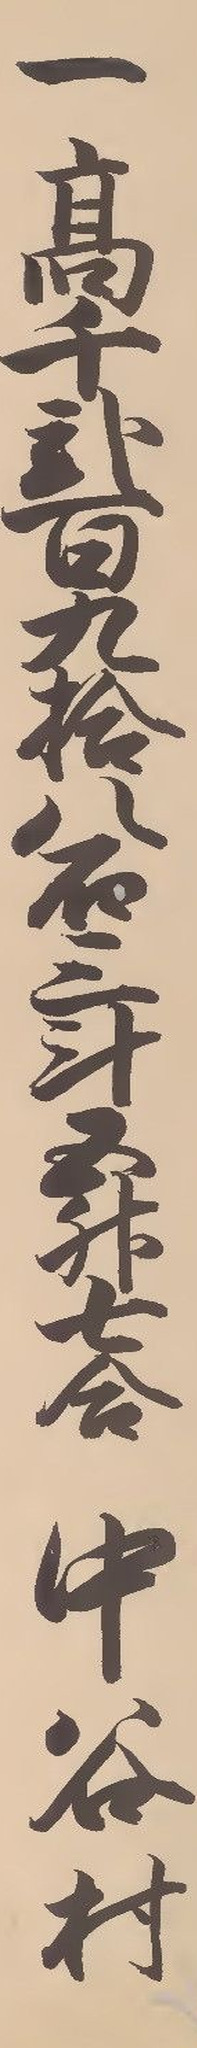一高千弐百九拾八石三斗五升七合中谷村
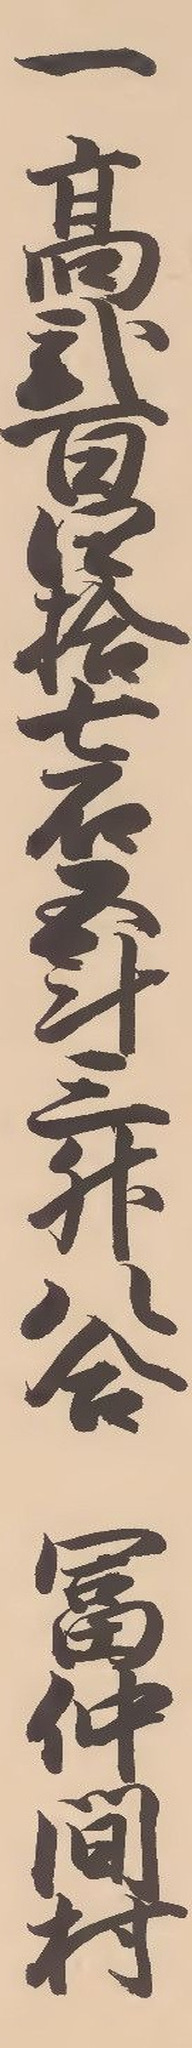一高弐百四拾七石五斗三升八合富仲間村
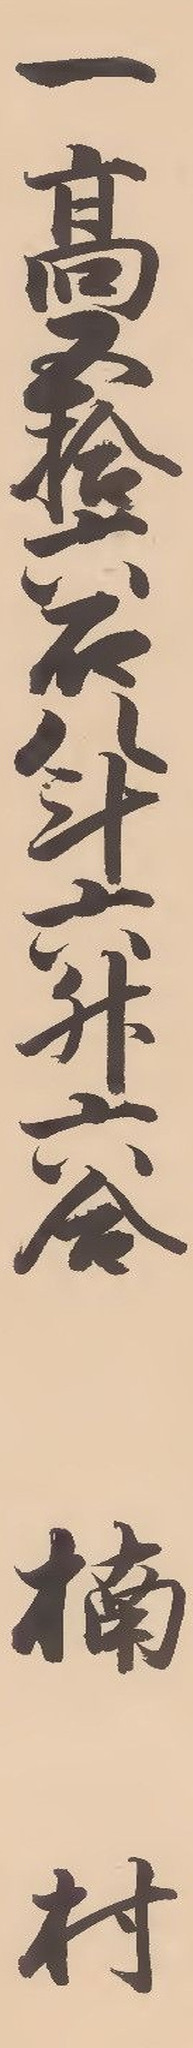一高五拾六石八斗六升六合楠村
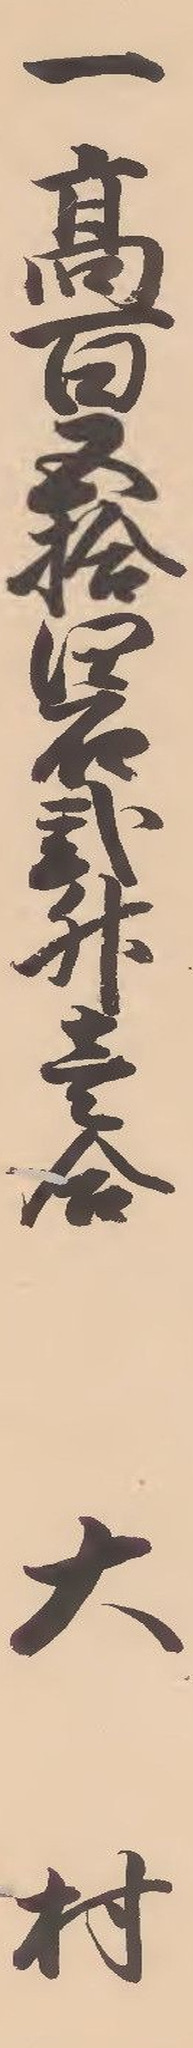一高百五拾四石弐升壱合大村

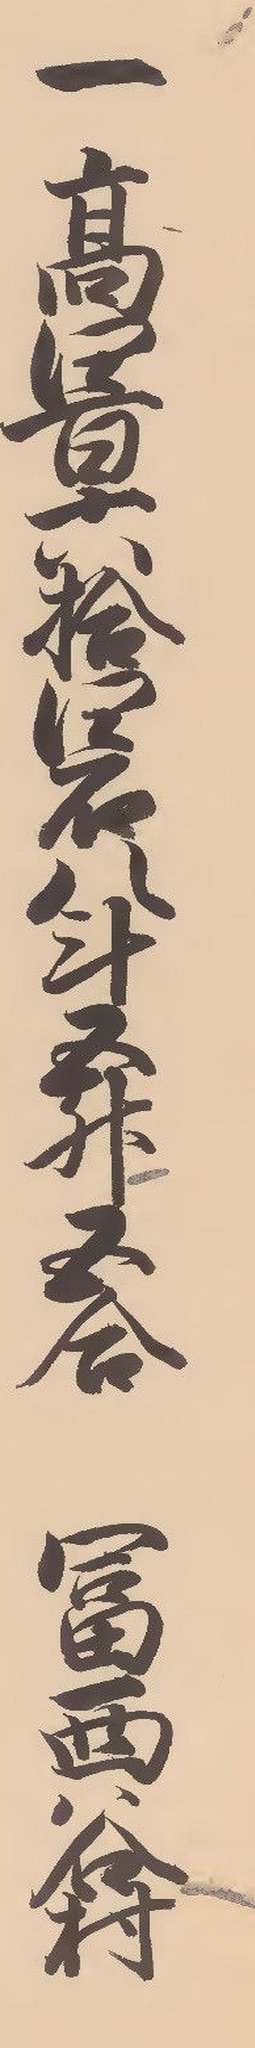一高四百六拾四石八斗五升五合富西谷村
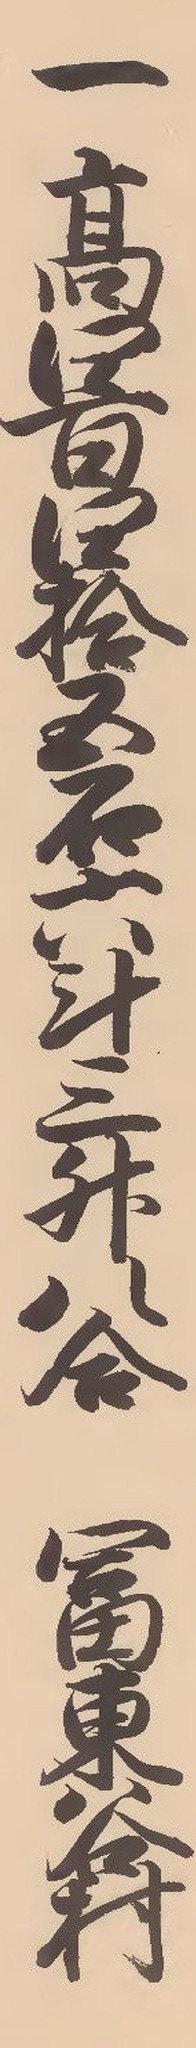一高四百四拾五石六斗三升八合富東谷村
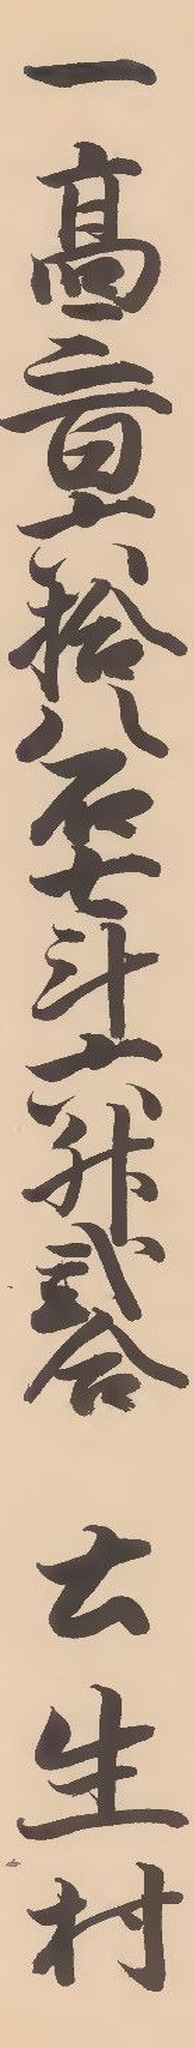一高三百六拾八石七斗六升弐合土生村
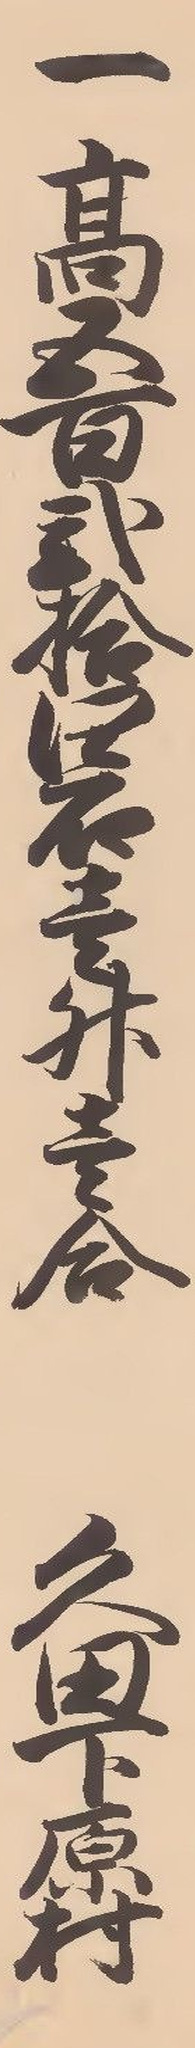一高五百弐拾四石壱升壱合久田下原村
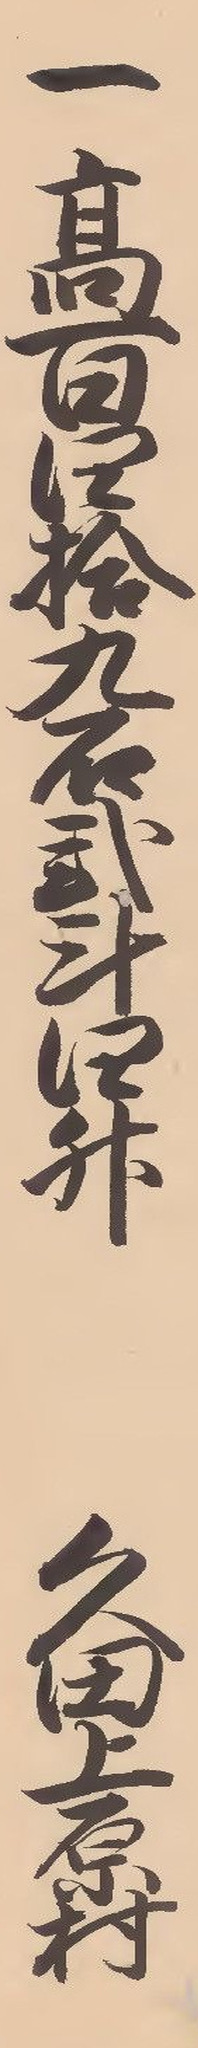一高百四拾九石弐斗四升久田上原村
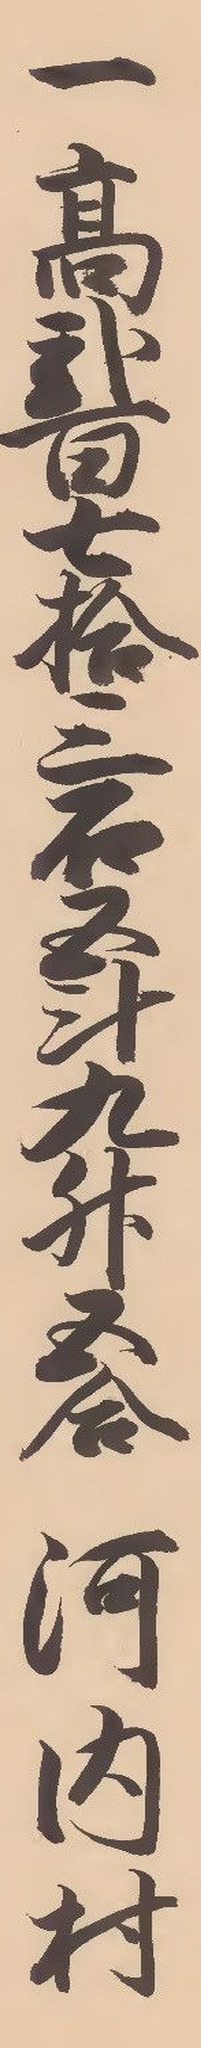一高弐百七拾三石五斗九升五合河内村
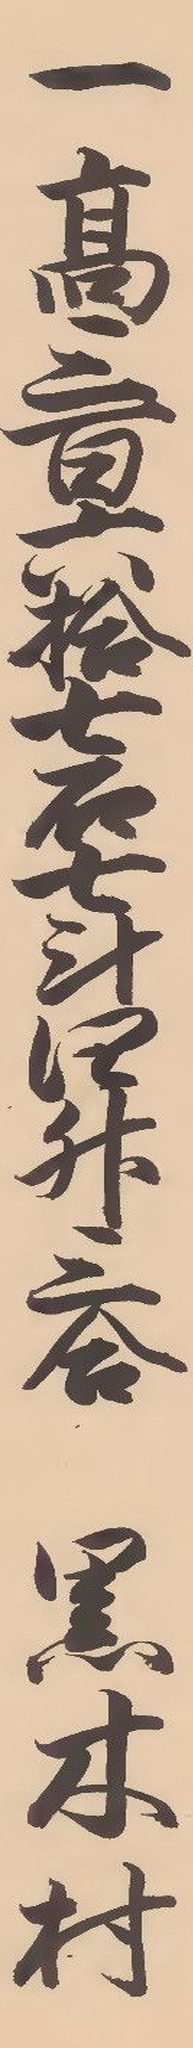一高三百六拾七石七斗四升三合黒木村
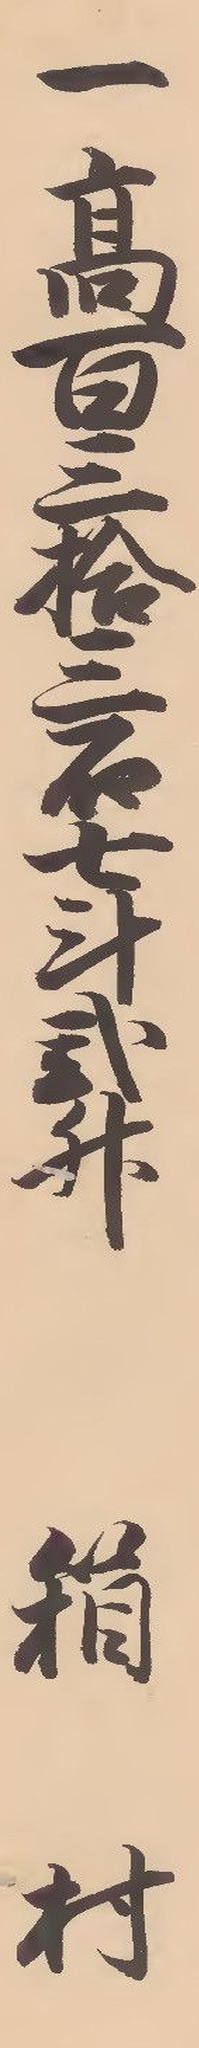一高百三拾三石七斗弐升箱村

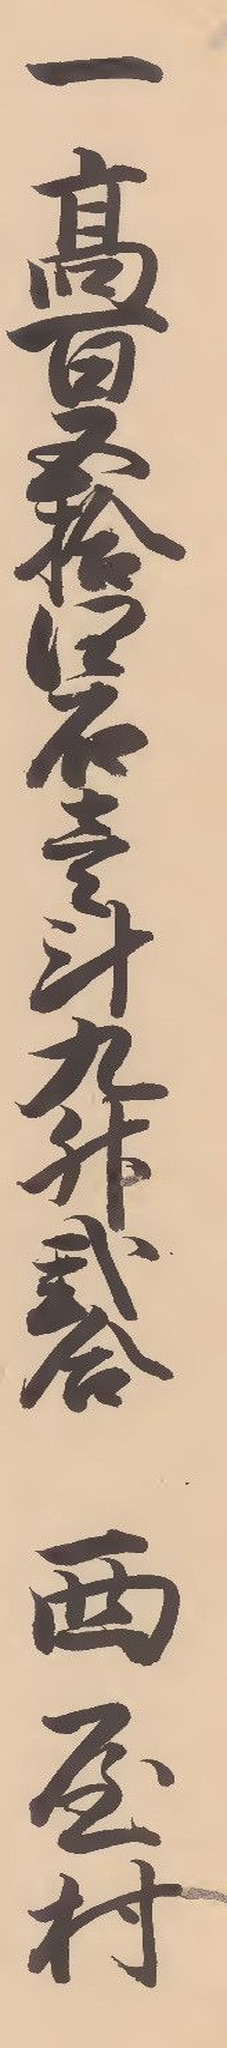一高百五拾四石壱斗九升弐合西屋村
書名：美作国郷帳
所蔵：国立公文書館 National Archives of Japan
